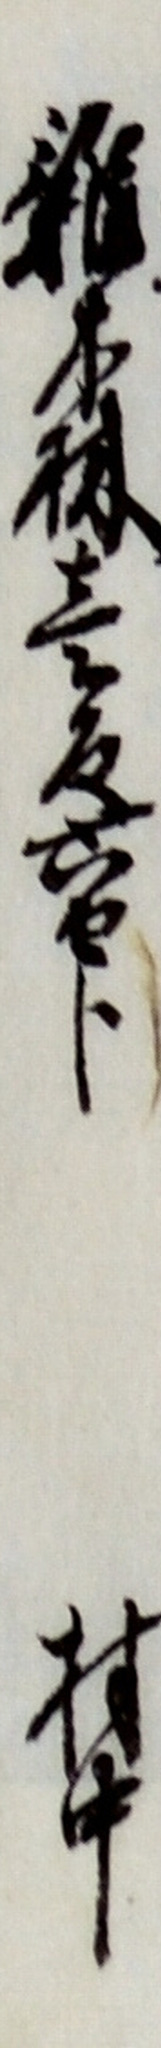雑木林壱反六セ歩村中
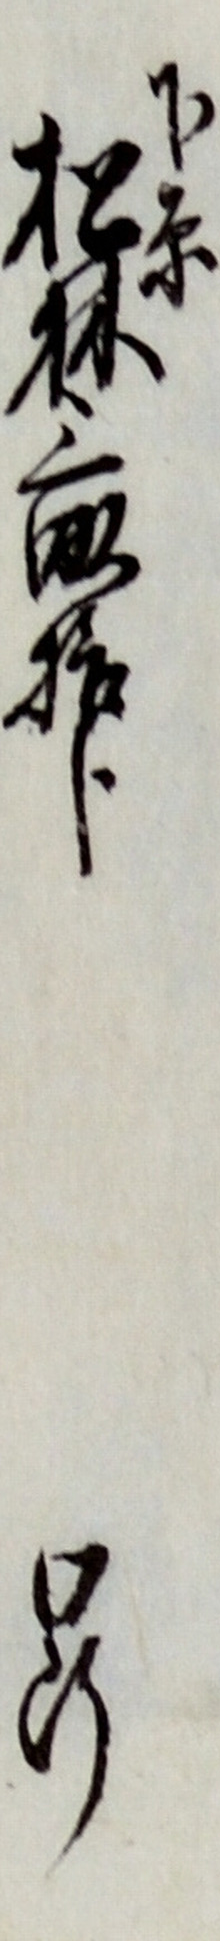松林三畝拾歩同断

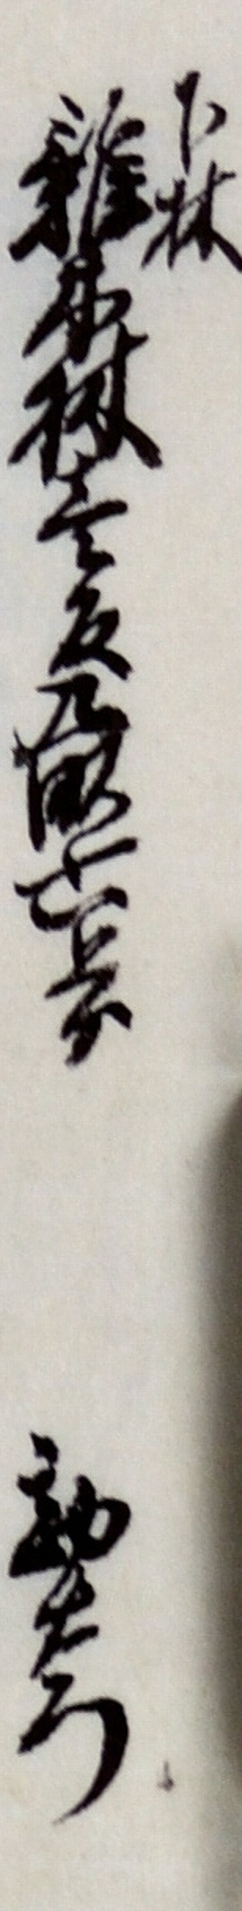雑木林壱反九畝六歩勘右衛門
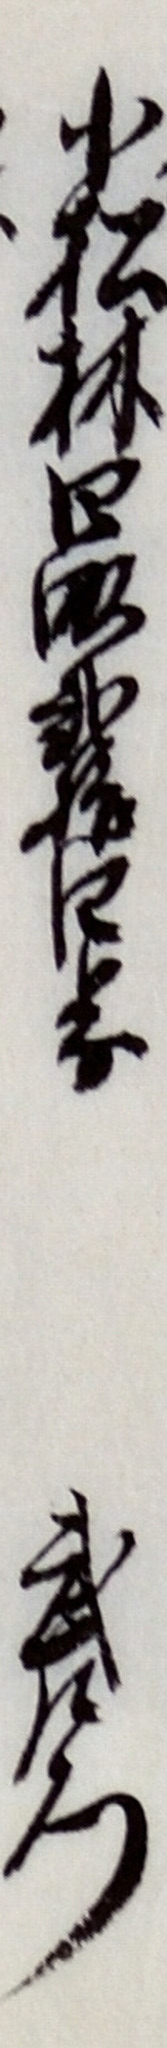小松林四畝弐拾四歩武左衛門
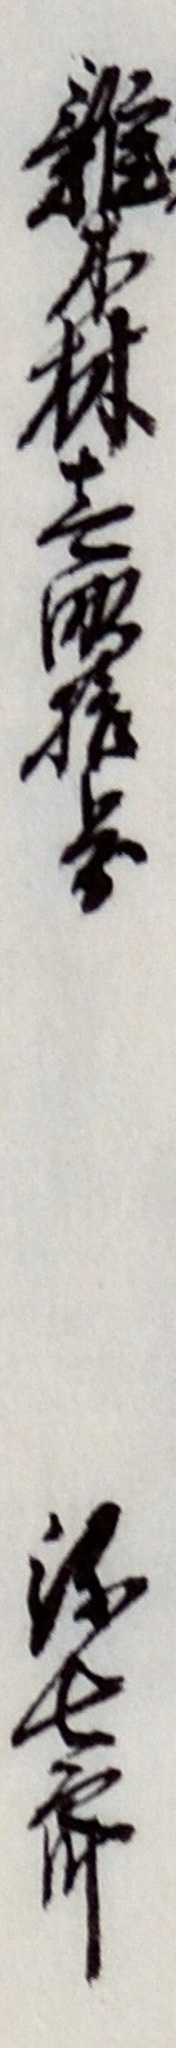雑木林壱畝拾歩弥七郎
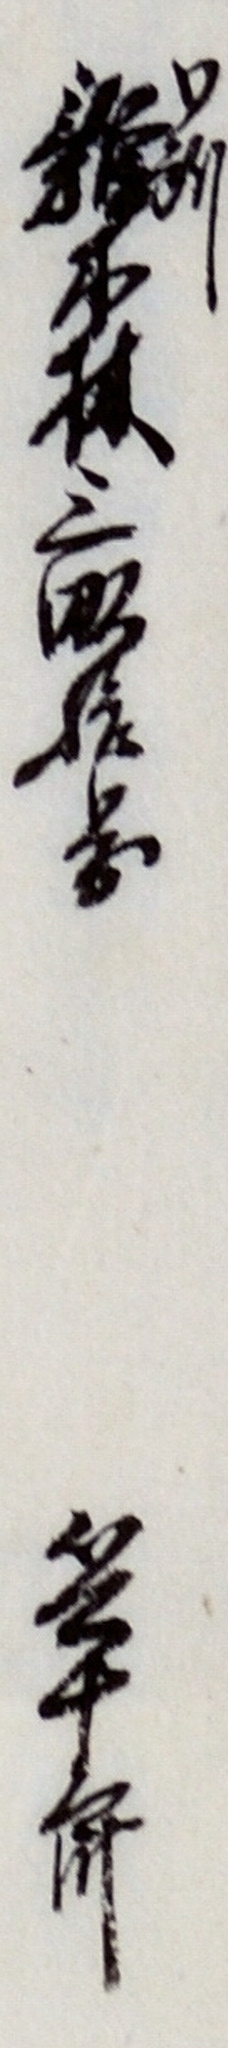雑木林三畝拾歩兵十郎
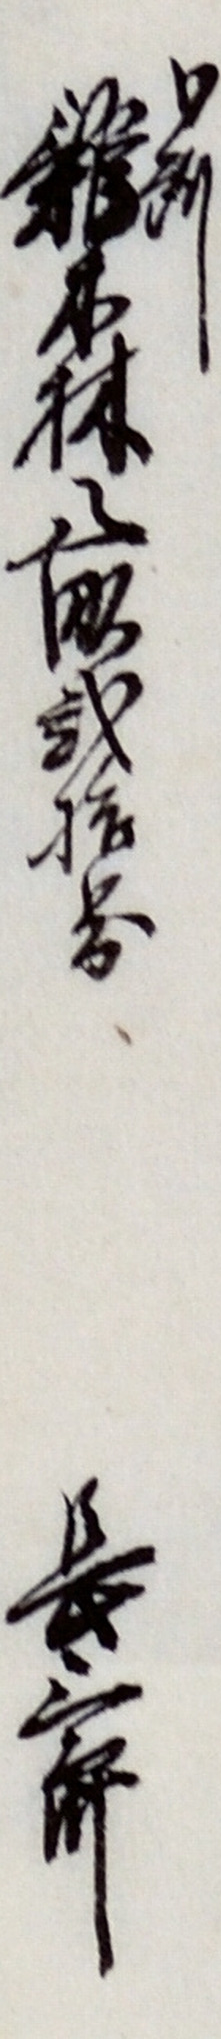雑木林八畝弐拾歩長三郎
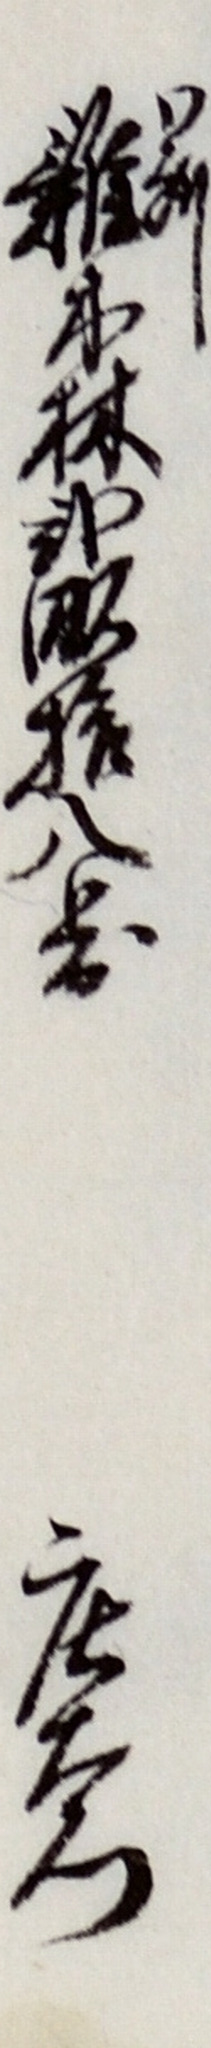雑木林弐畝拾八歩庄太郎
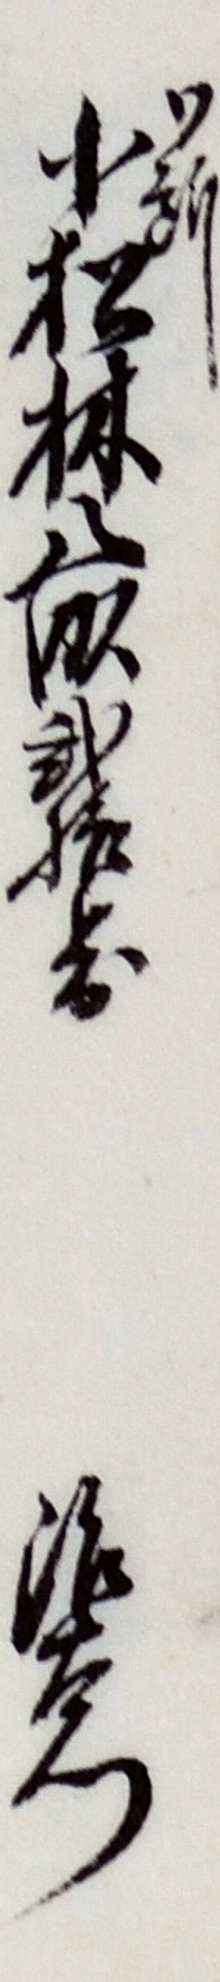小松林八畝弐拾歩治右衛門
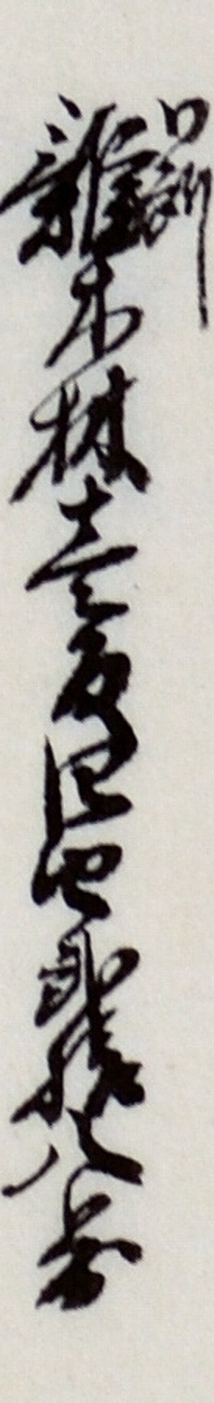雑木林壱反四セ弐拾八歩善兵衛
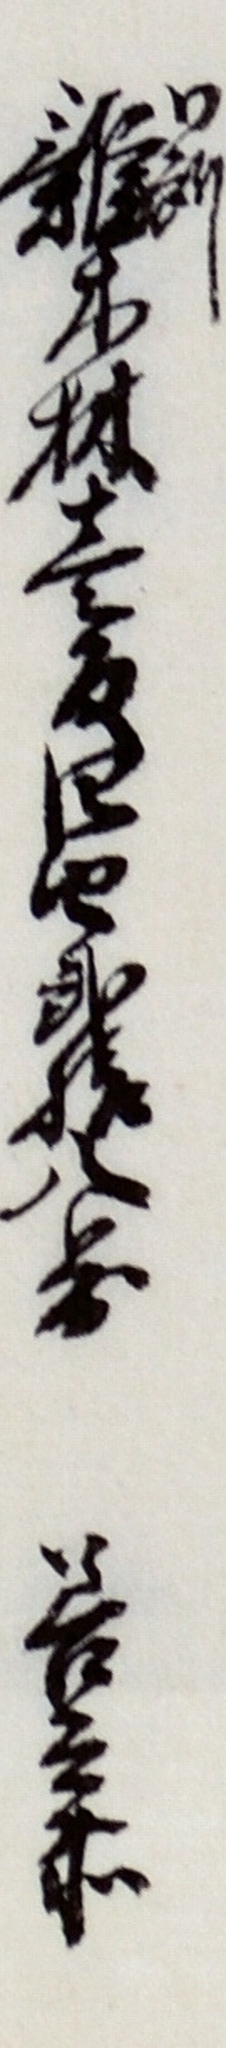雑木林壱反四セ弐拾八歩善兵衛
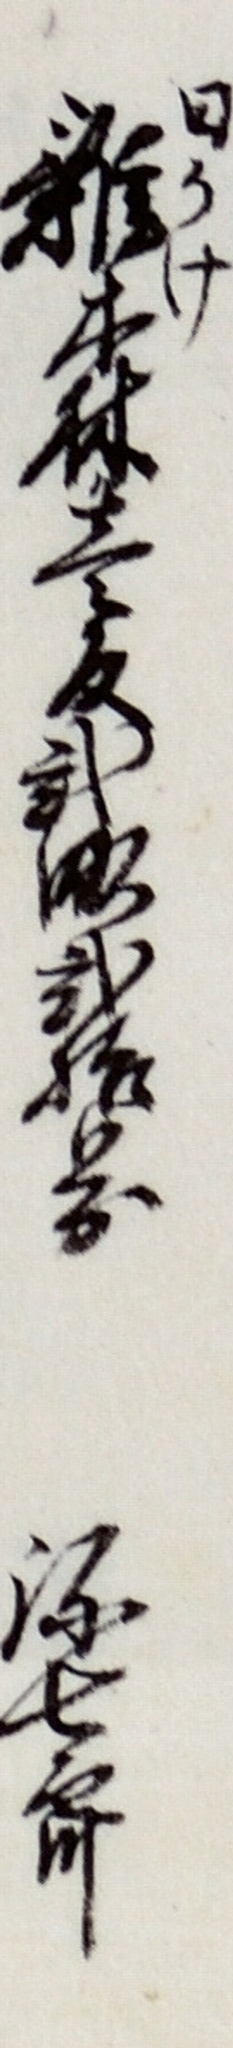雑木林壱反弐畝弐拾歩弥七郎
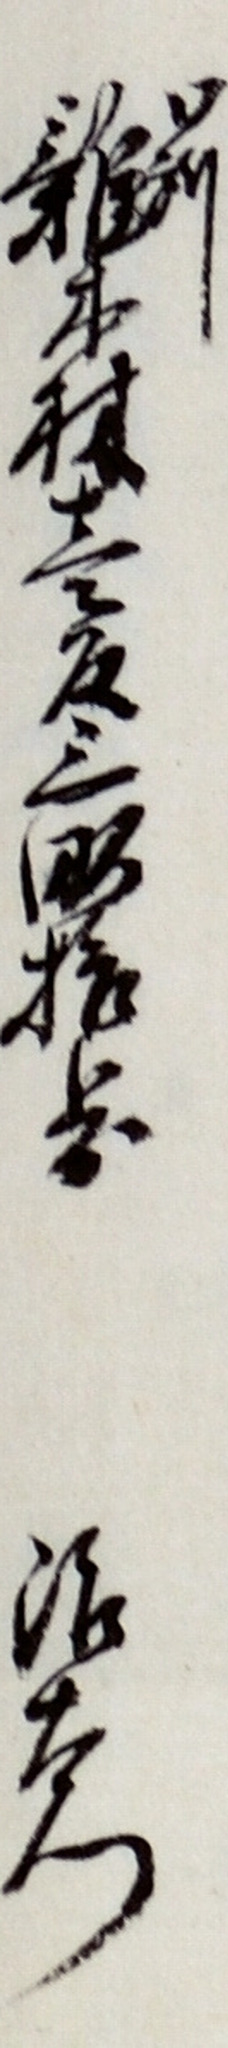雑木林壱反三畝拾歩治右衛門
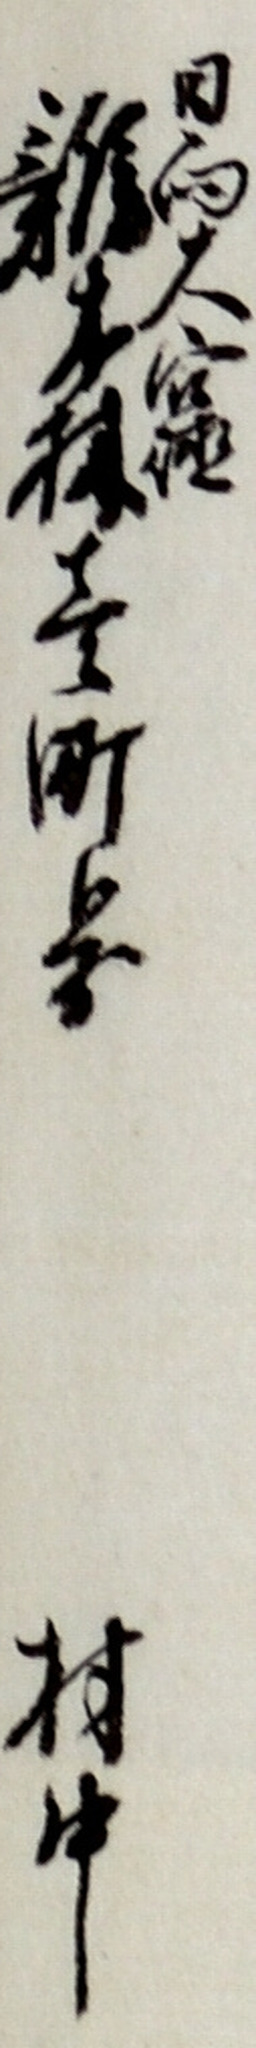雑木林壱町歩村中
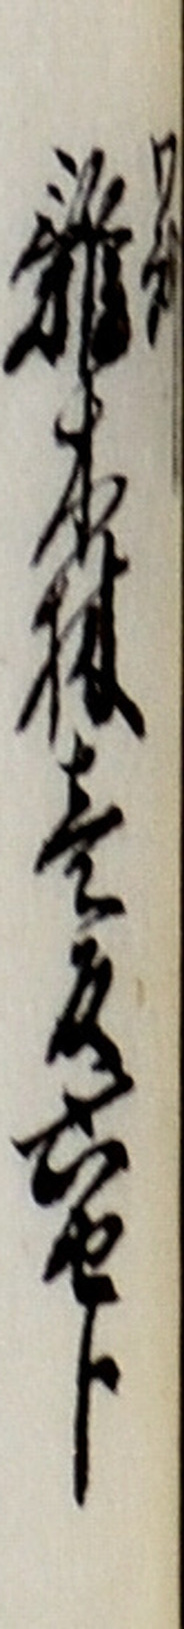雑木林壱反六セ歩同断
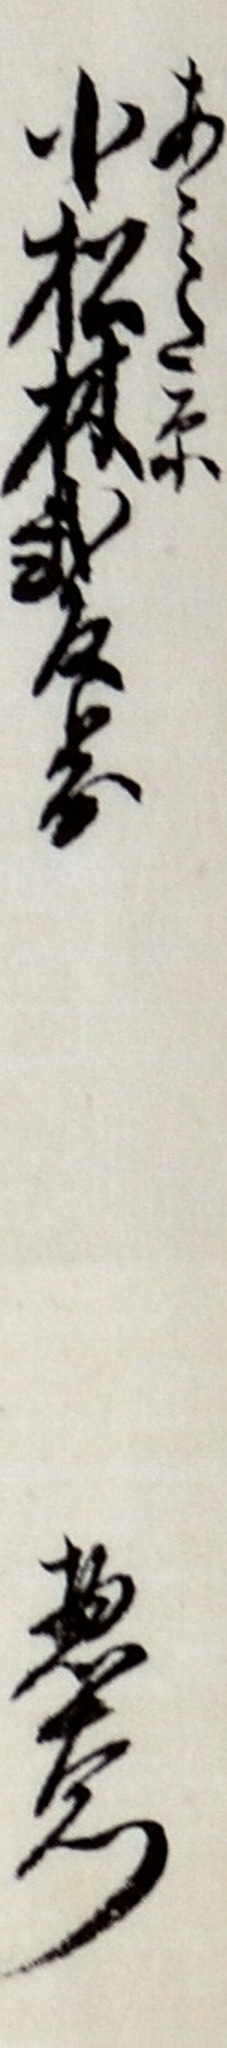小松林弐反歩惣右衛門
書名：御領分中山林社地手控
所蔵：伊那市立高遠町図書館・合同会社AMANE
